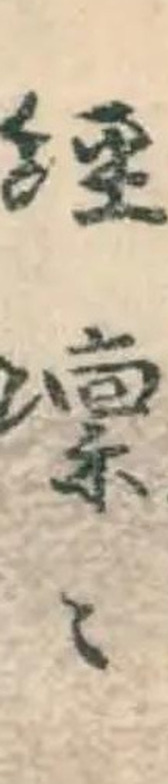経凛々
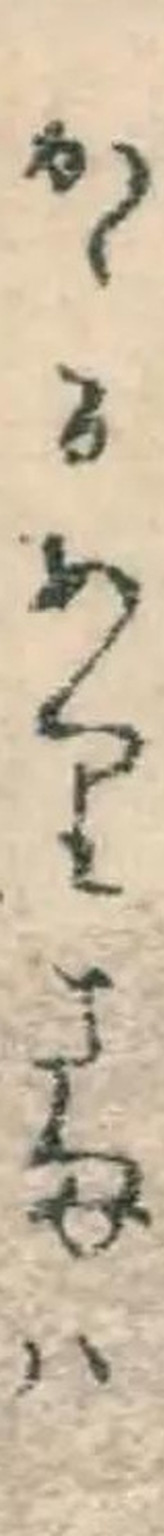かゝるありさまは
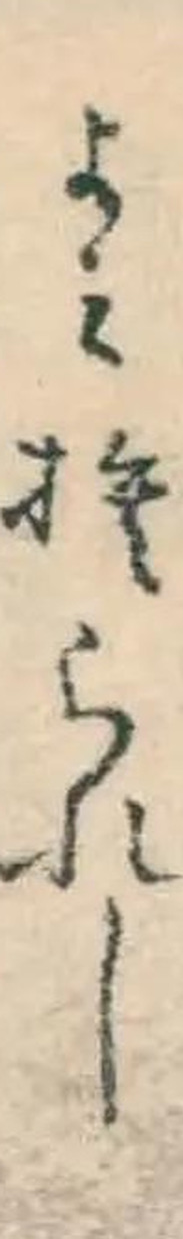よみ捨られし
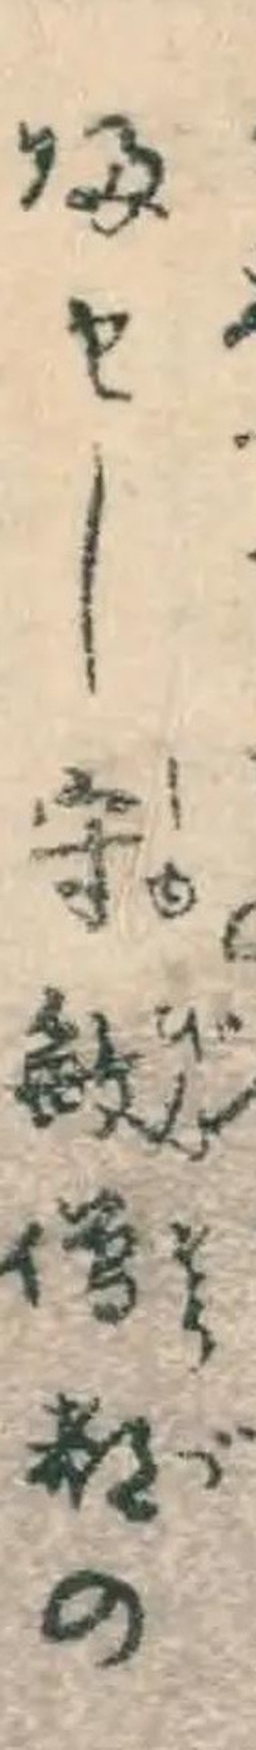帰せし守敏僧都の
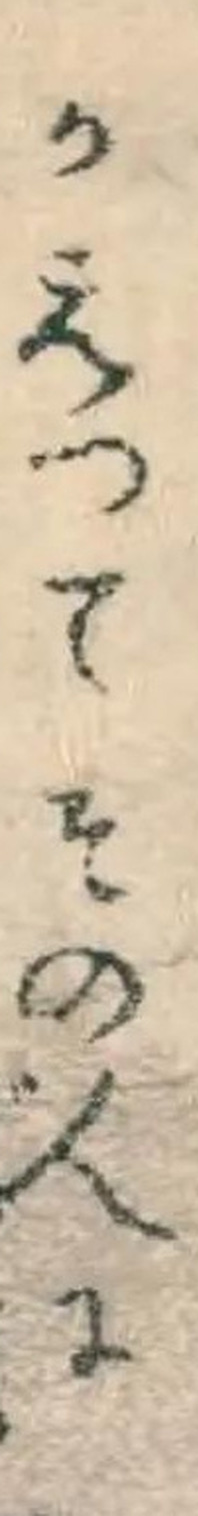かえつてその人に
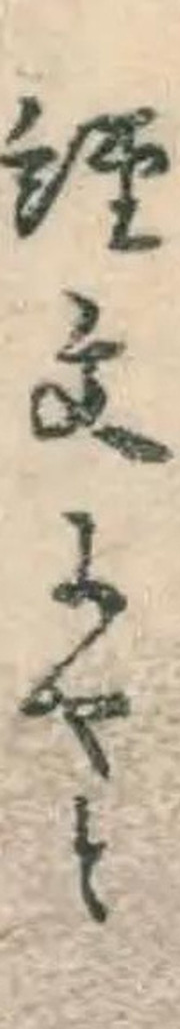経文にやと
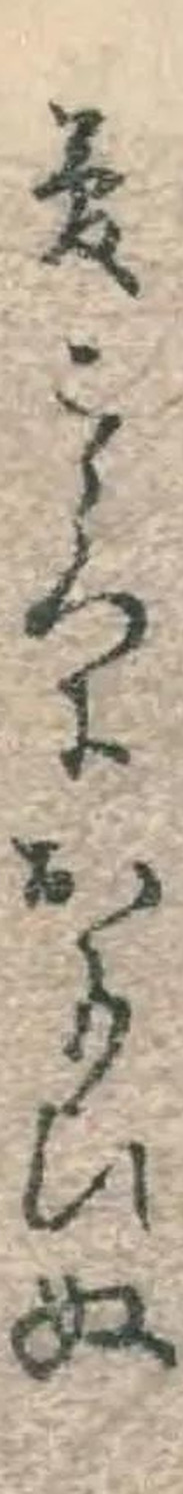夢こゝろにおもひぬ
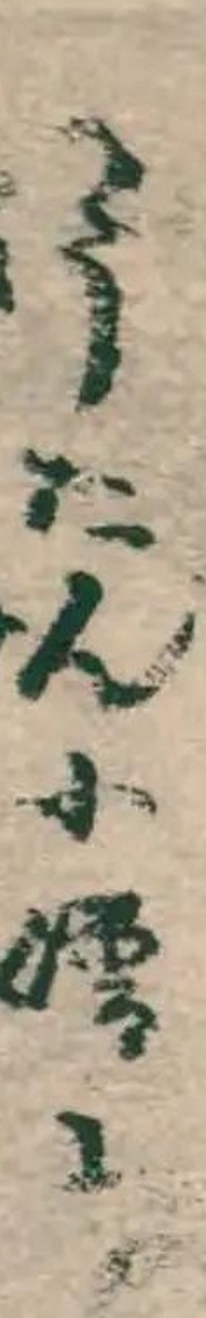へうたん小僧に
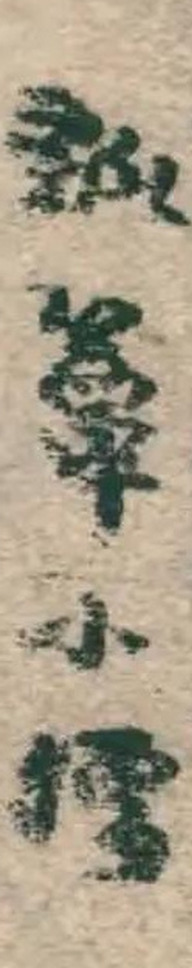瓢箪小僧
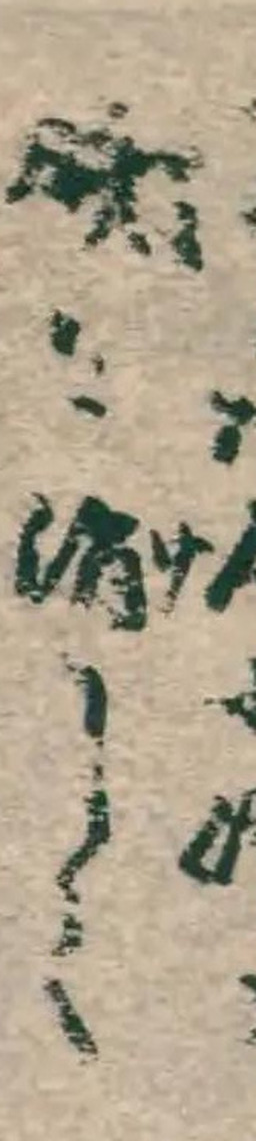肝を消して
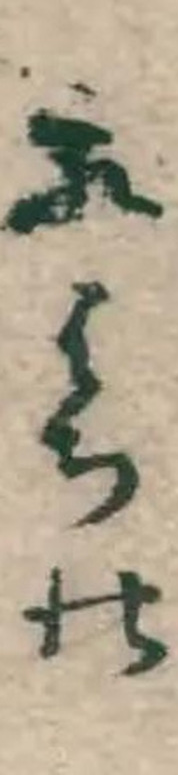乳はちの
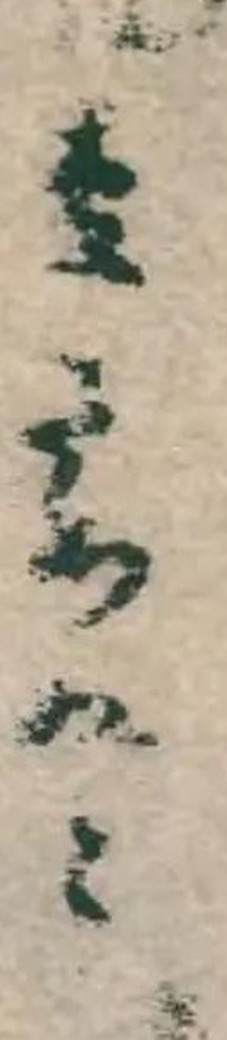夢さめぬと
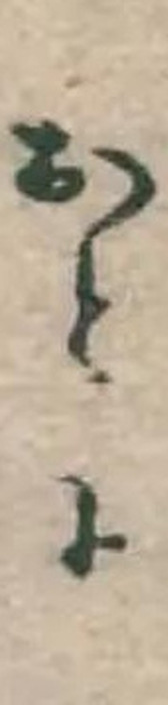おとに

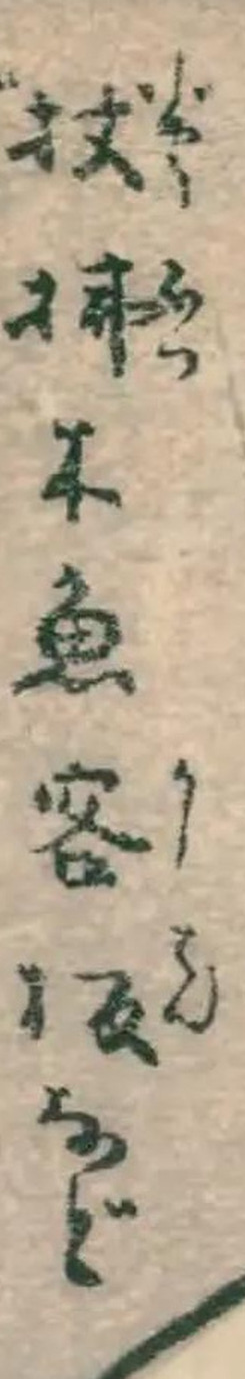杖拂木魚客板など
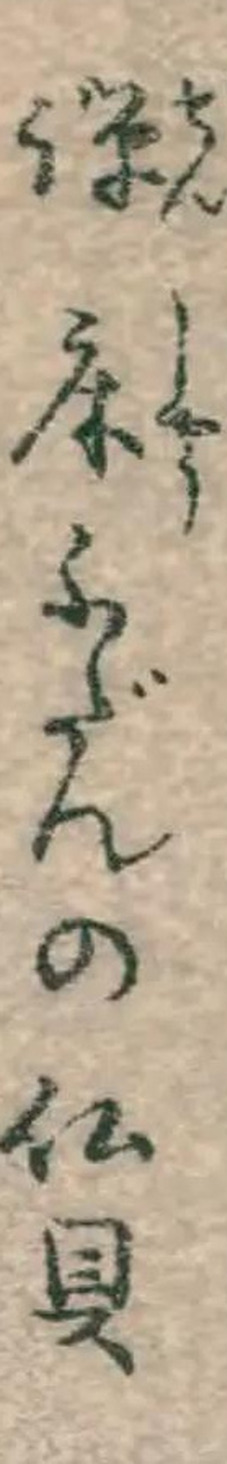禅床ふだんの仏具
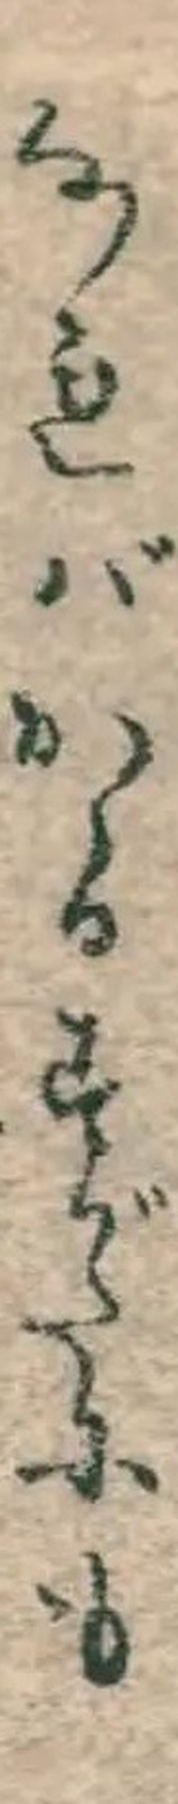なればかゝるすがたにも
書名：百鬼徒然袋 3巻. [2]
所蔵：国立国会図書館 National Diet Library, JAPAN
